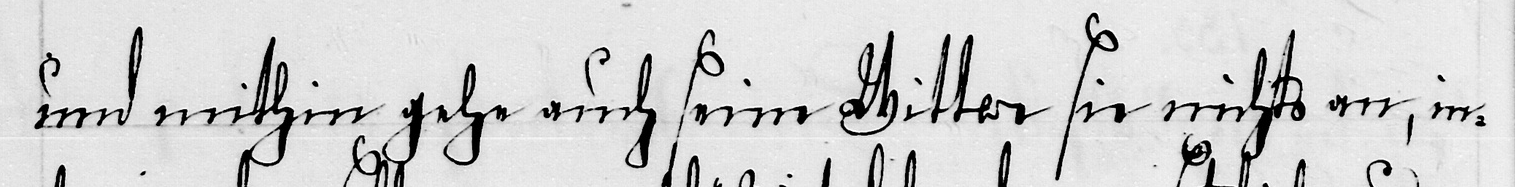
und mithin gehe auch seine Wittwe sie nichts an, in¬
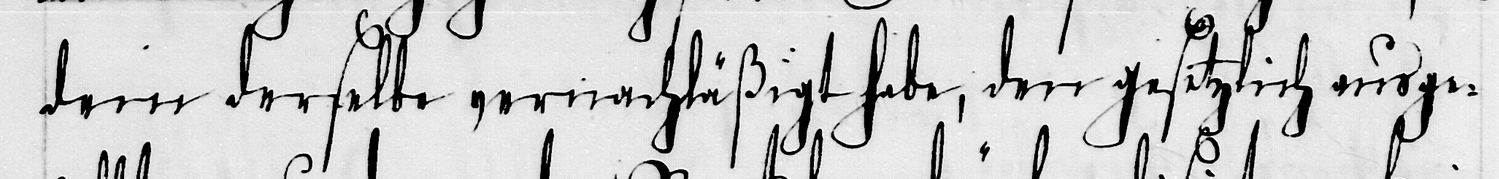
dem derselbe vernachläßigt habe, den gesetzlich ausge¬
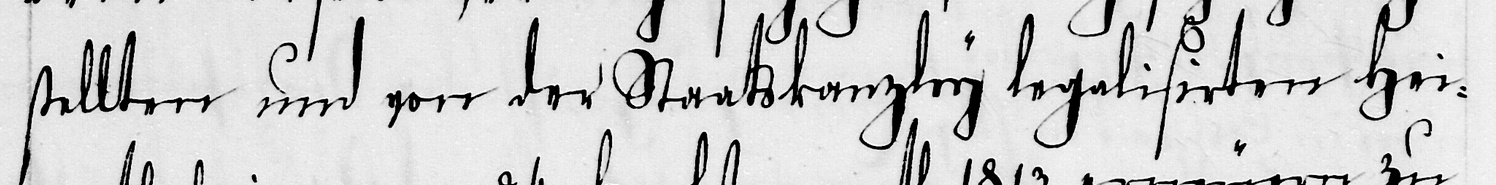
stellten und von der Staatskanzley legalisirten Hei¬
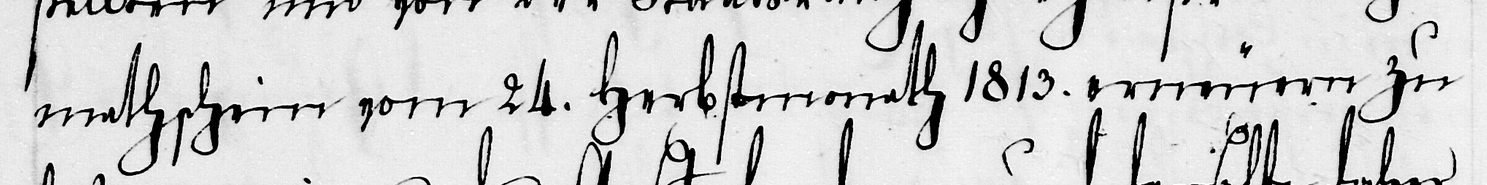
mathschein vom 24. Herbstmonath 1813. erneuern zu
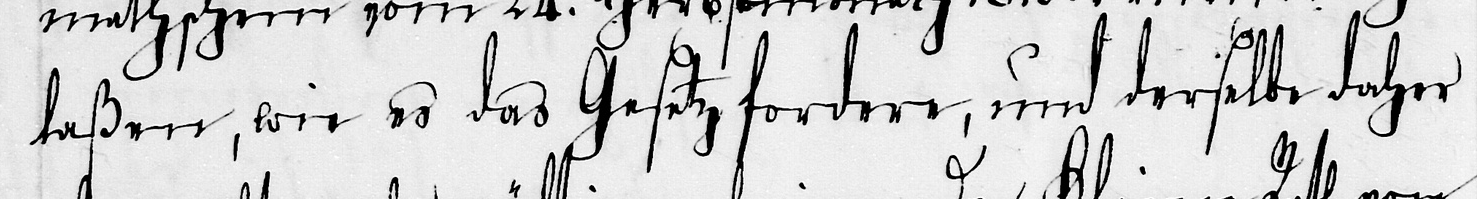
laßen, wie es das Gesetz fordere, und derselbe daher
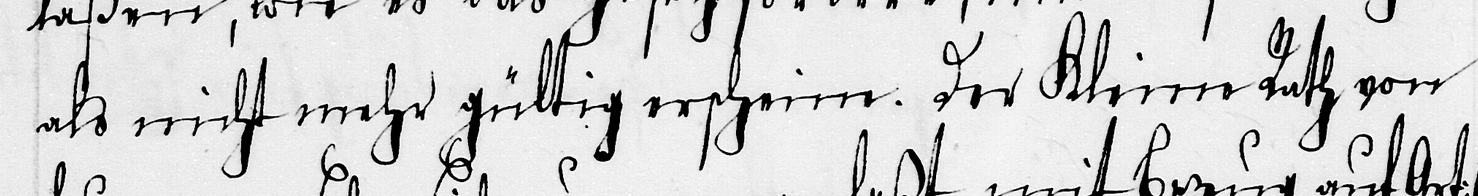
als nicht mehr gültig erscheine. Der Kleine Rath von
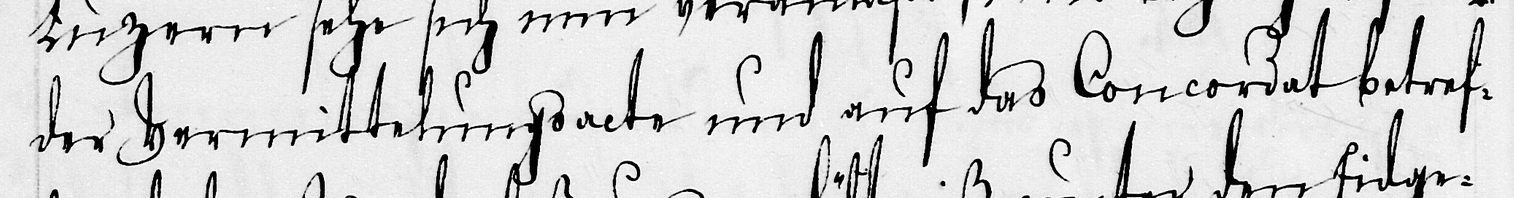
der Vermittelungsacte und auf das Concordat betref¬
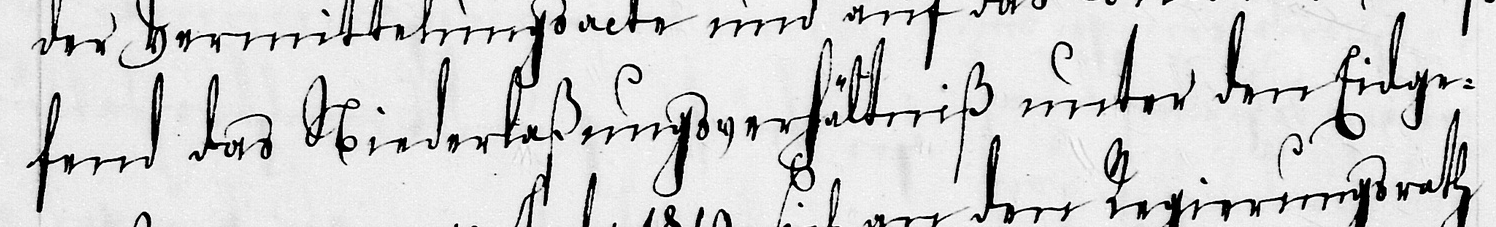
fend das Niederlaßungsverhältniß unter den Eidge¬
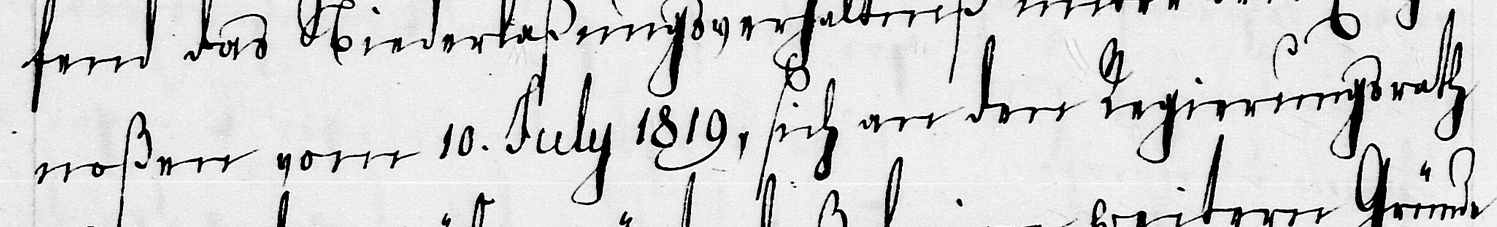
noßen vom 10. July 1819, sich an den Regierungsrath
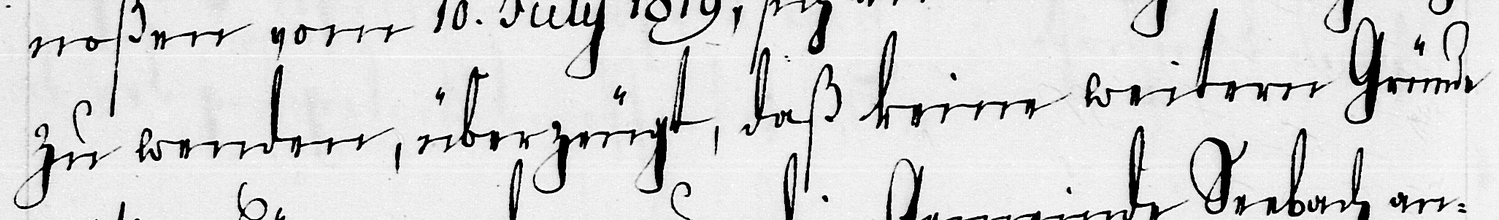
zu wenden, überzeugt, daß keine weitern Gründe
